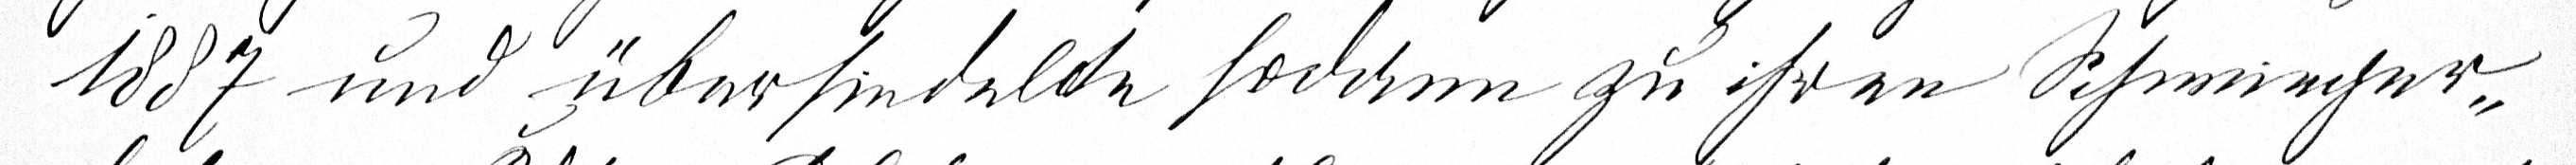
1887 und übersiedelte sodann zu ihren Schwieger¬
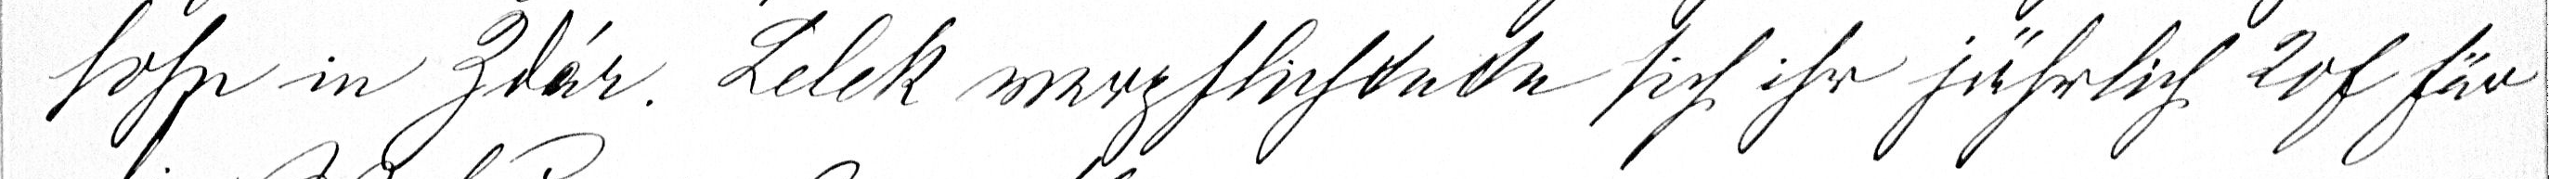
hofe in Zdár. Lelek verpflichtete sich ihr jährlich Kof für
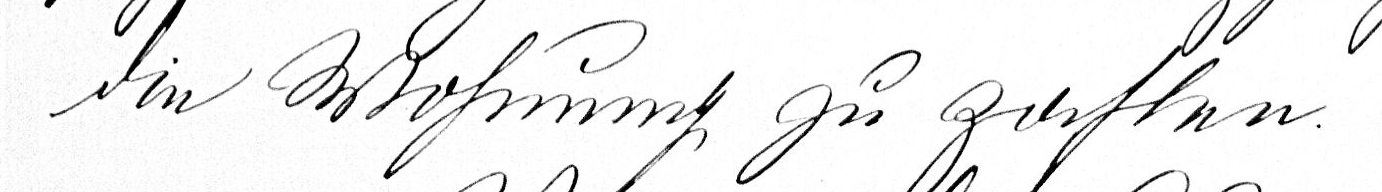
die Wohnung zu zahlen.
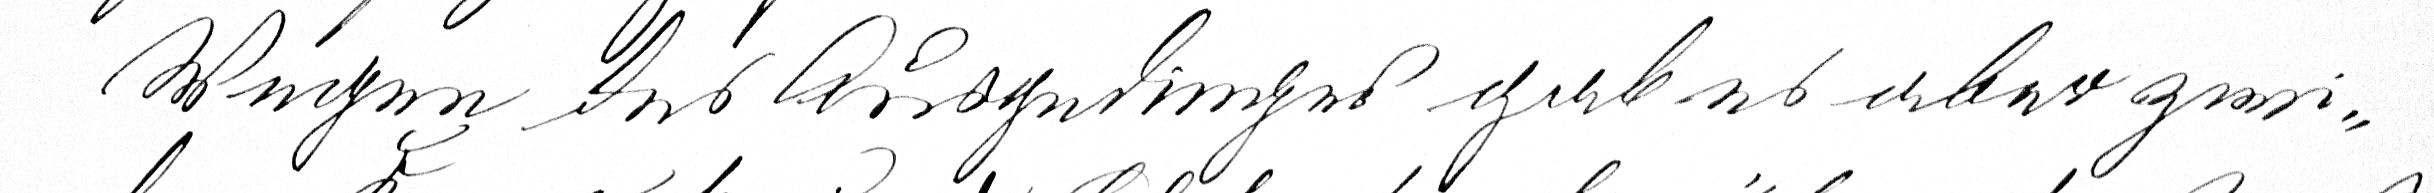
Wegen des Ausgedinges gab es aber zwi¬
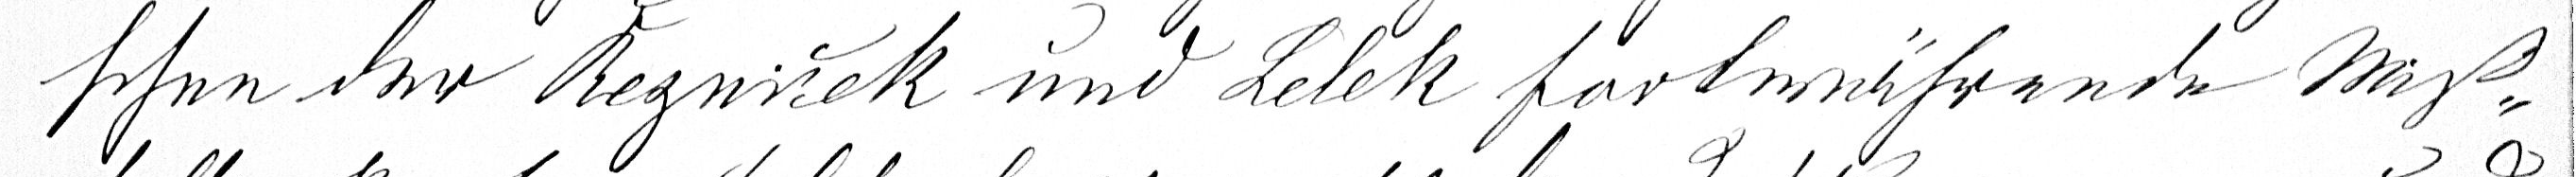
schen der Rezniček und Lelek fortwährende Miß¬
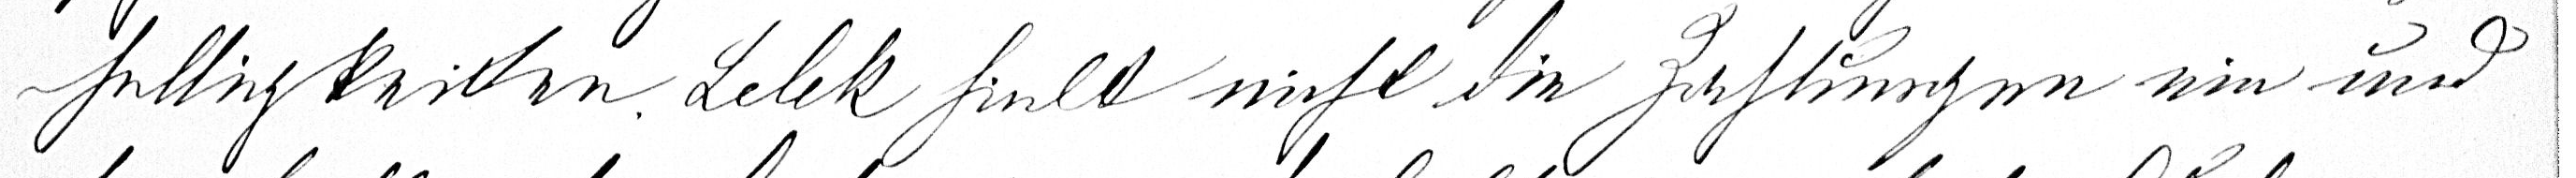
helligkeiten Lelek hielt nicht die Zahlungen ein und
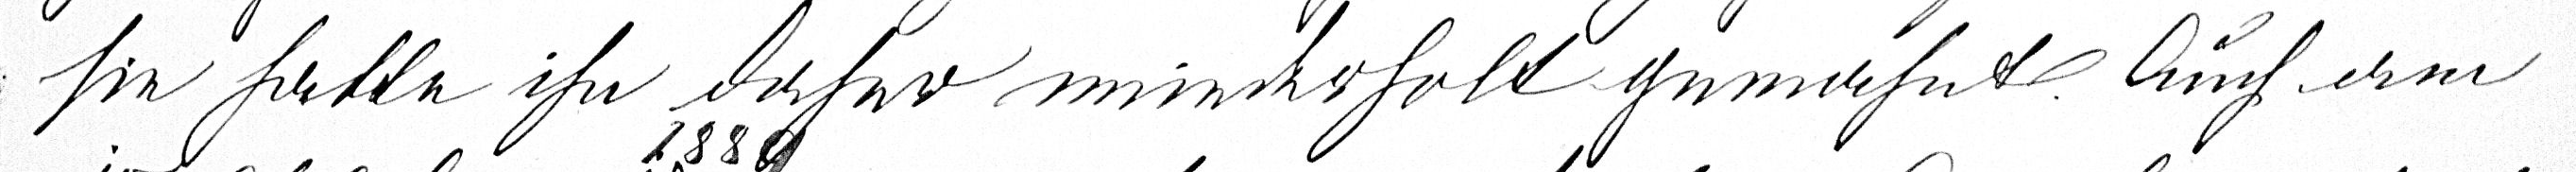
sie hatte ihn daher wiederholt gemahnt. Auch am
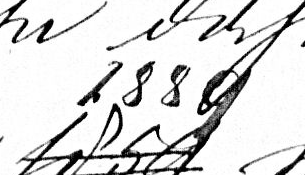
1889
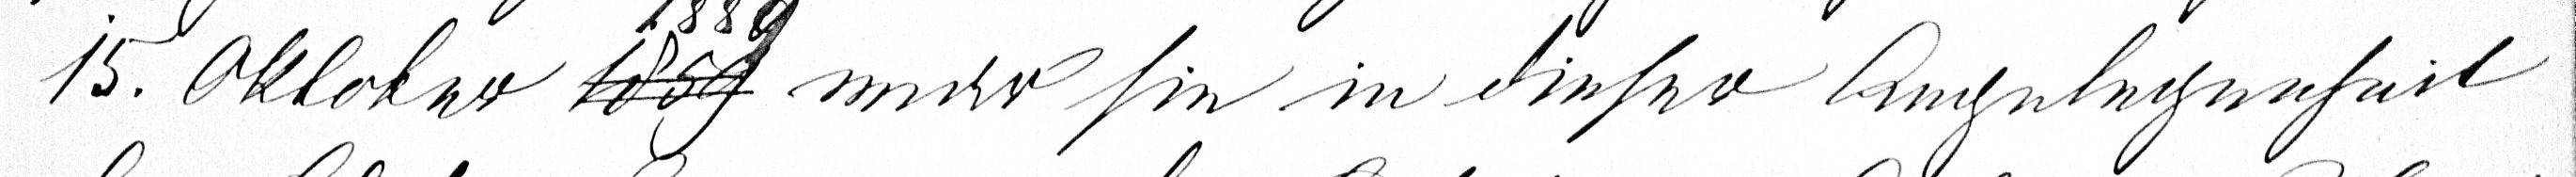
15. Oktober war sie in dieser Angelegenheit
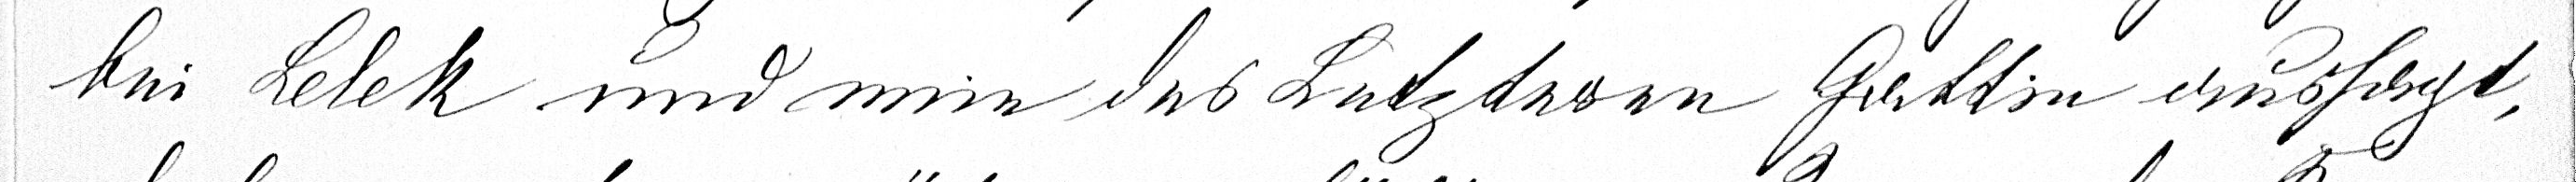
bei Lelek und wie des Letzteren Gattin aussagt,
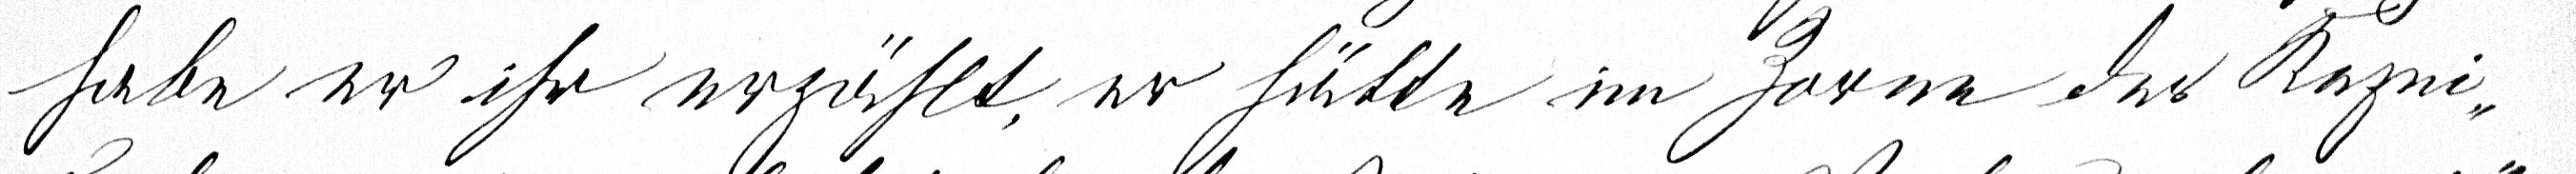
habe er ihr erzählt, er hätte im Zorne der Rezni¬
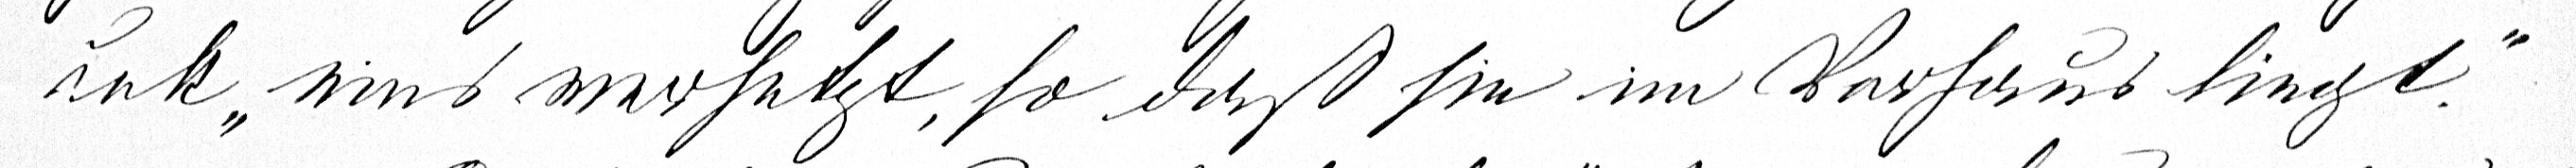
ček-eins versetzt, so daß sie im Verhaus liegt."
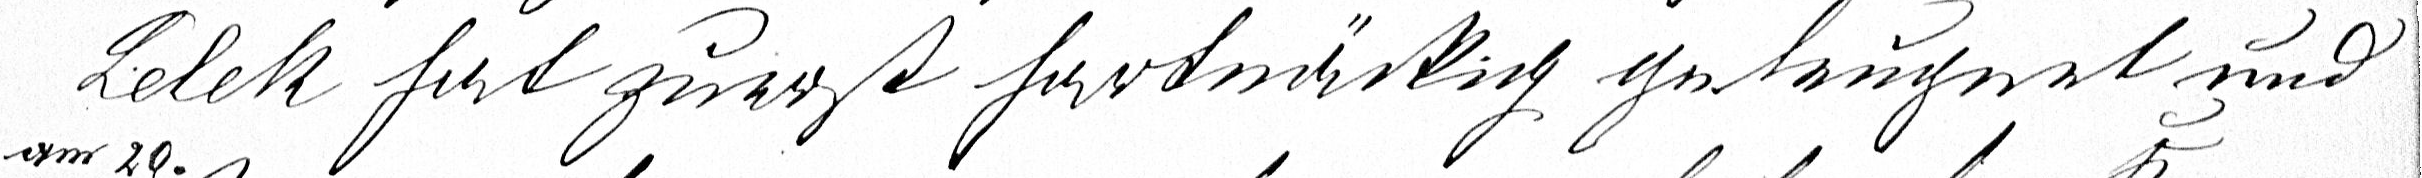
Lelek hat zuerst hartnäckig geleugnet und
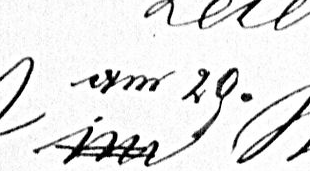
am 29.
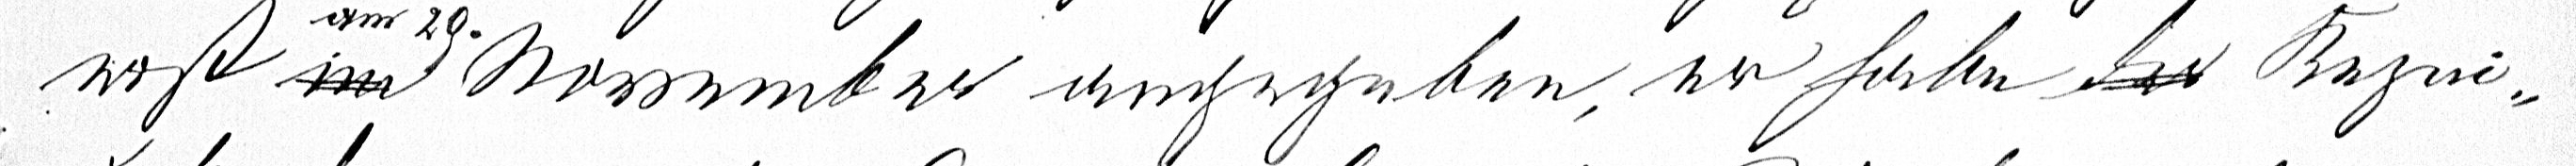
erst November angegeben, er habe Rezni¬
